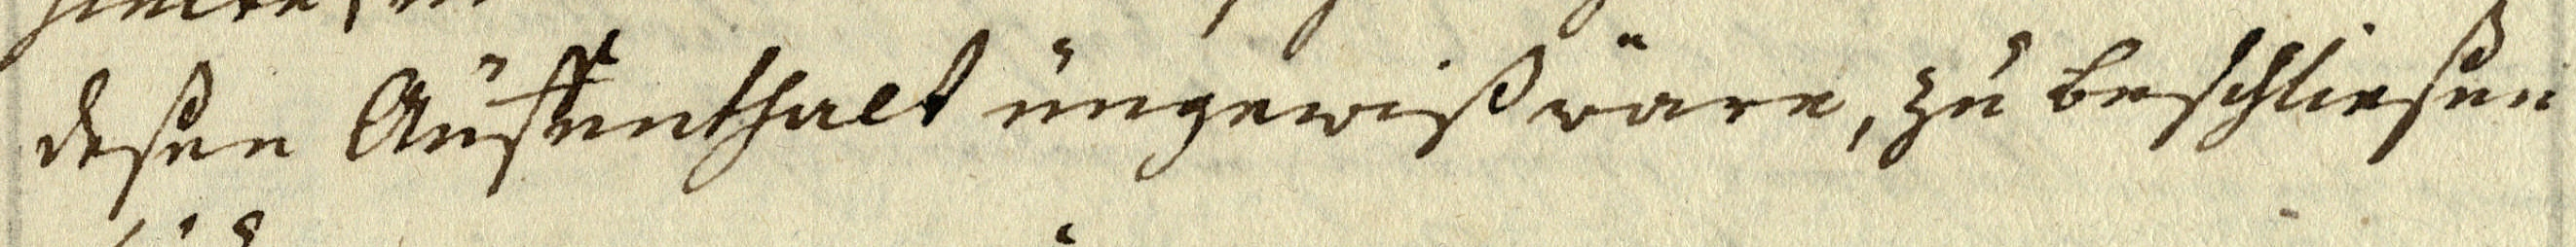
deßen Auffenthalt ungewiß wäre, zu beschließen
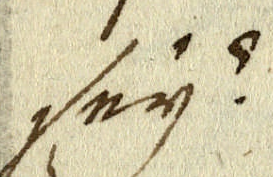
seÿ?
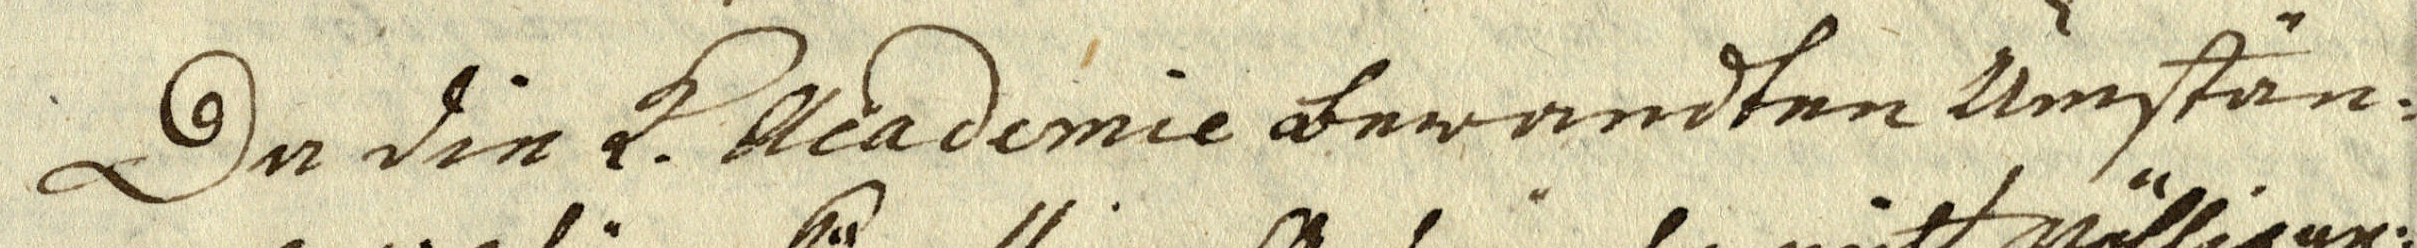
Da die K. Academie bewandten Umstän¬
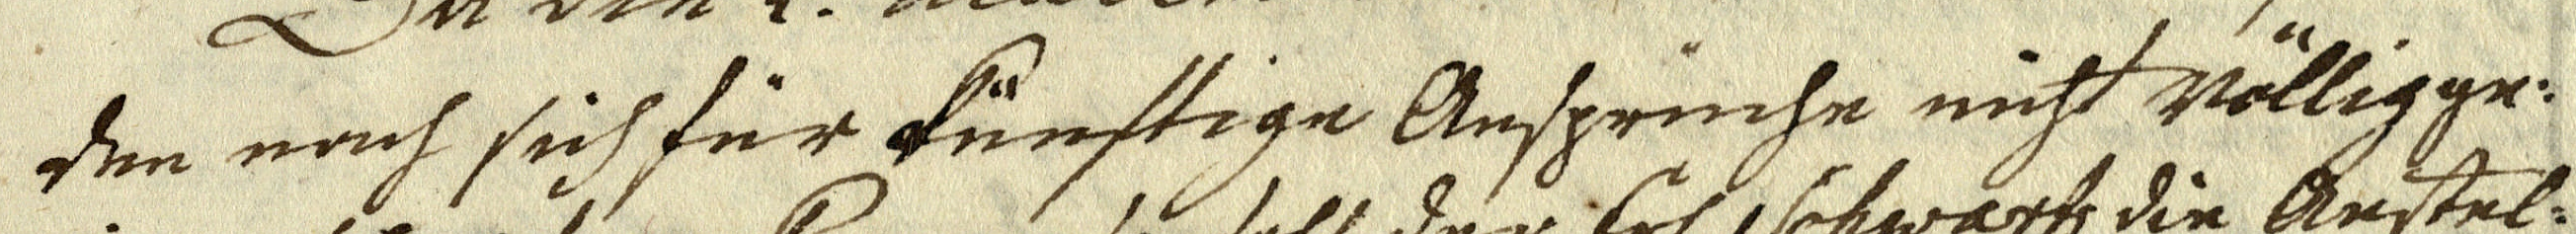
den nach sich für künftige Ansprüche nicht völlig ge¬
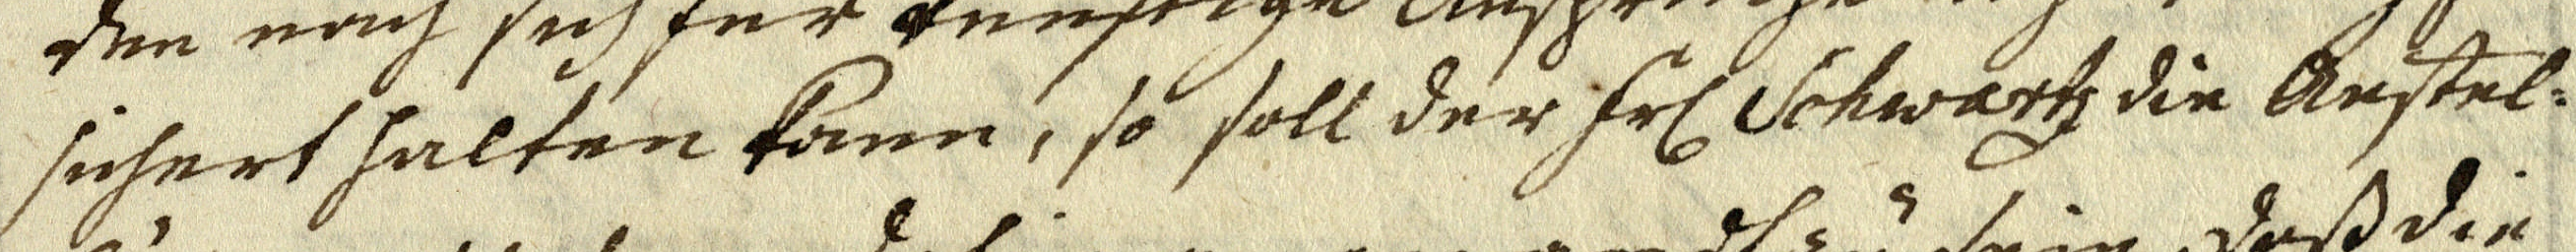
sichert halten kann, so soll der Frl. Schwartz die Anstel¬
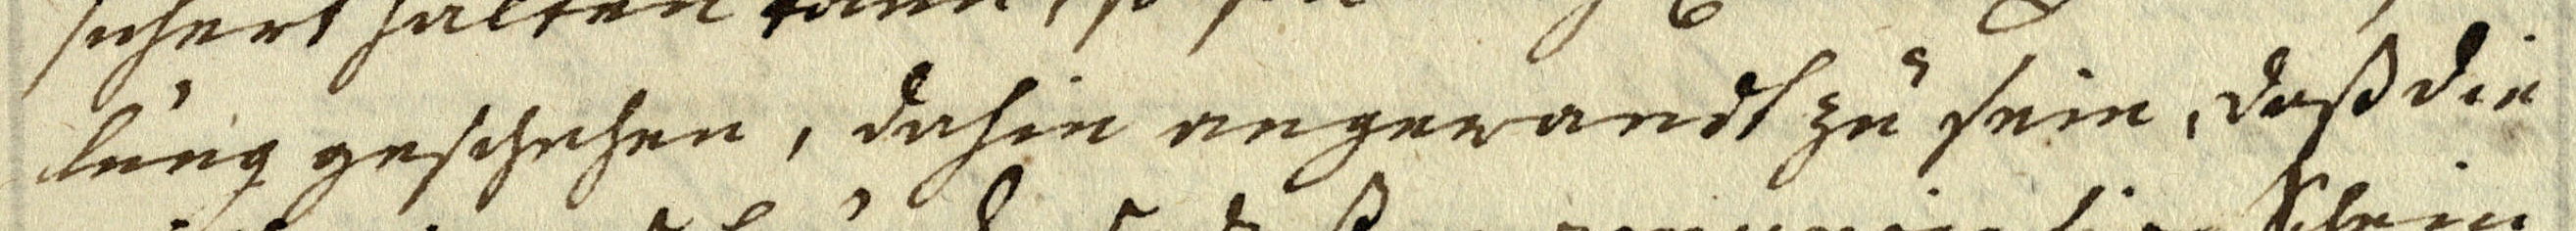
lung geschehen, dahin angewandt zu sein, daß die
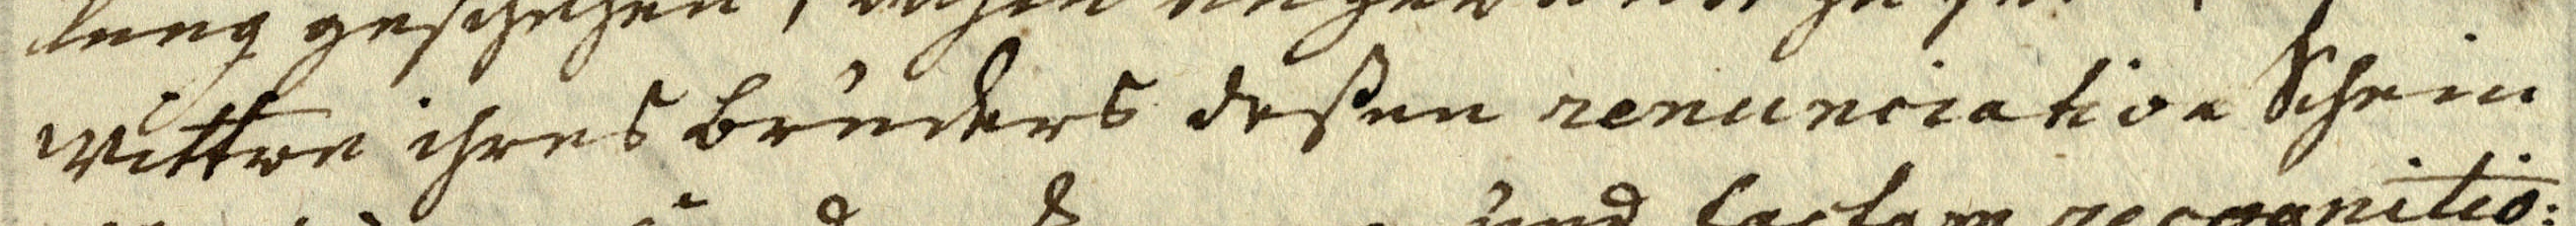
Wittwe ihres Bruders deßen renunciation Schein
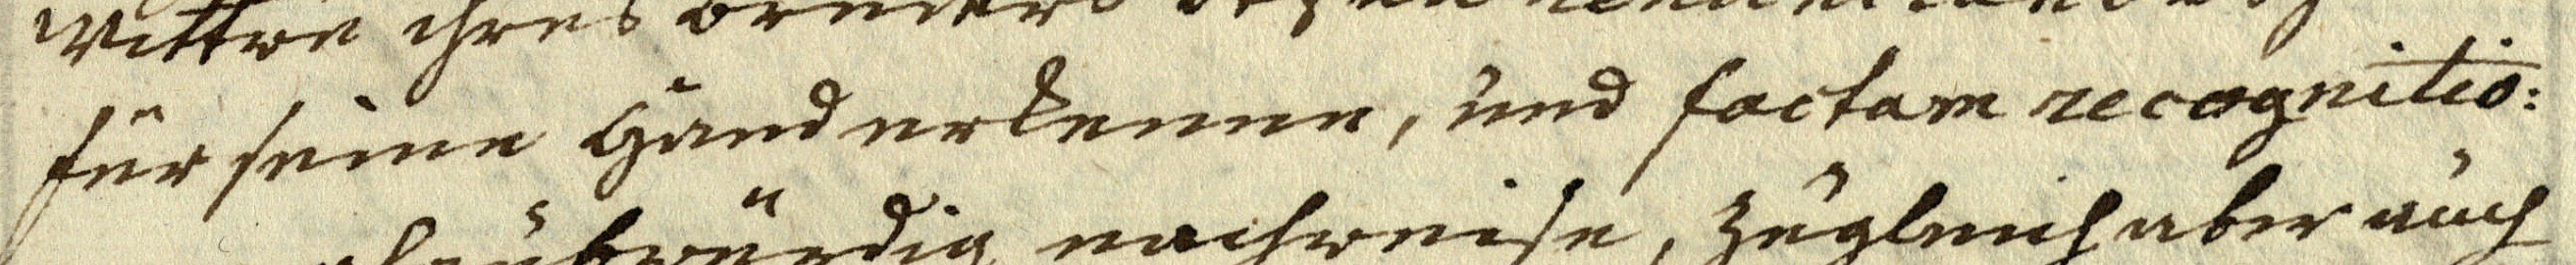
für seine Hand erkennen, und factam recognitio¬
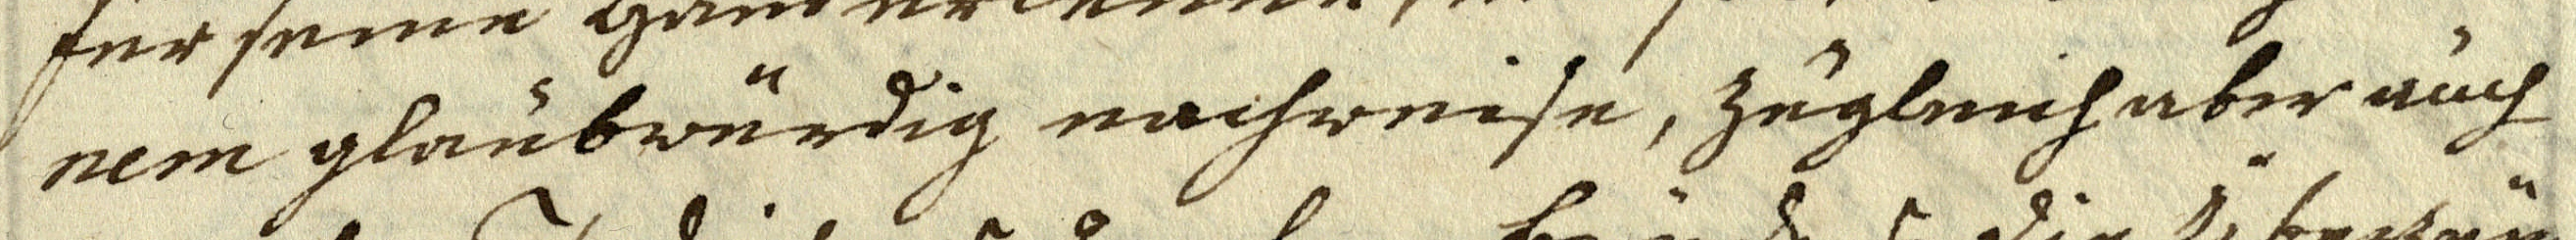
nem glaubwürdig nachweise, zugleich aber auch
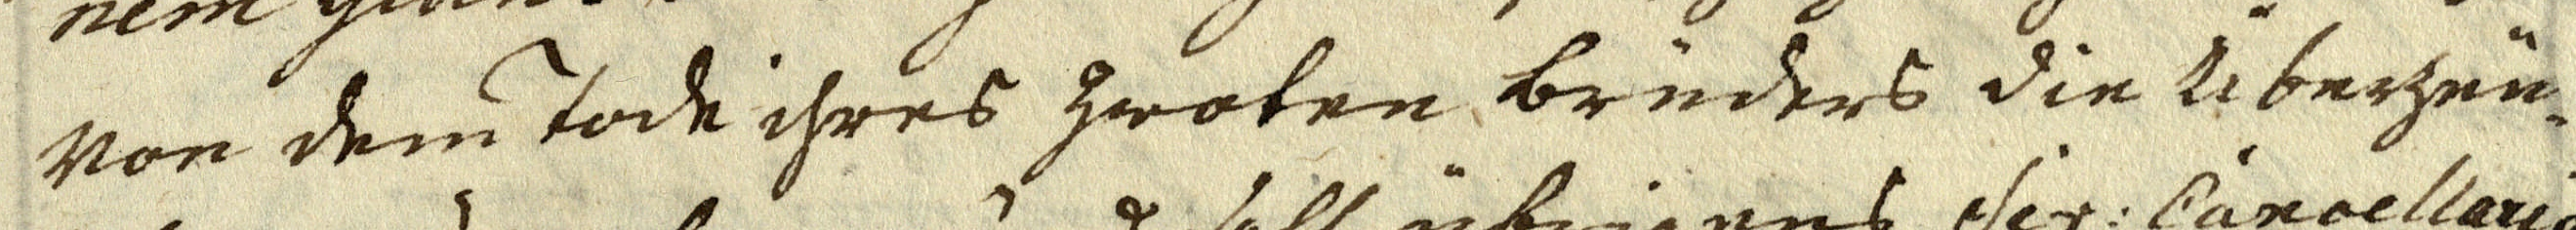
von dem Tode ihres zwoten Bruders die Überzeu¬
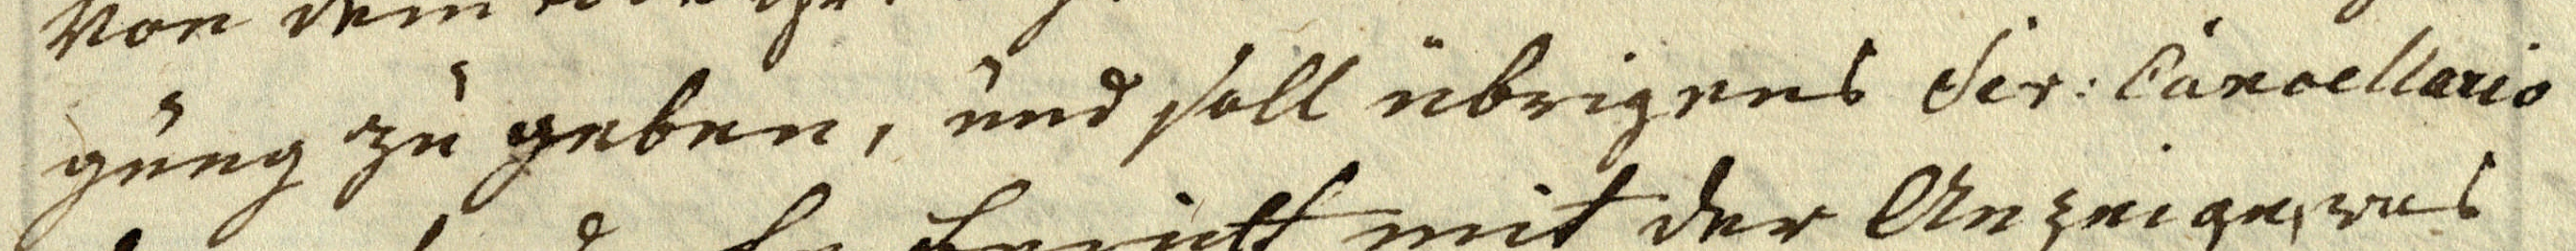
gung zu geben, und soll übrigens Ser. Cancellario
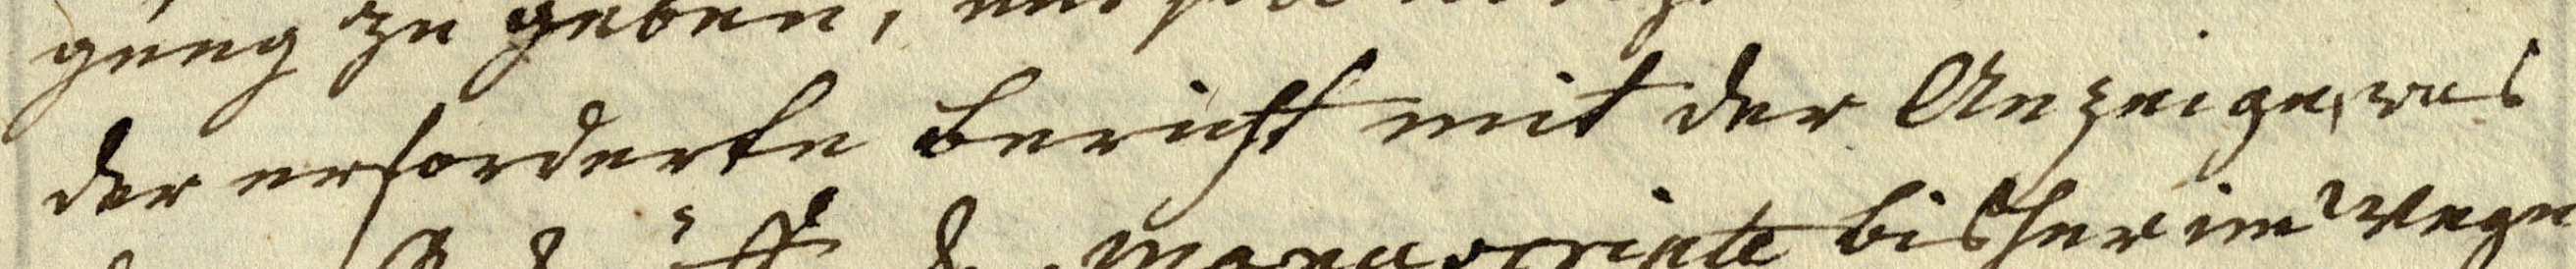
der erforderte Bericht mit der Anzeige, was
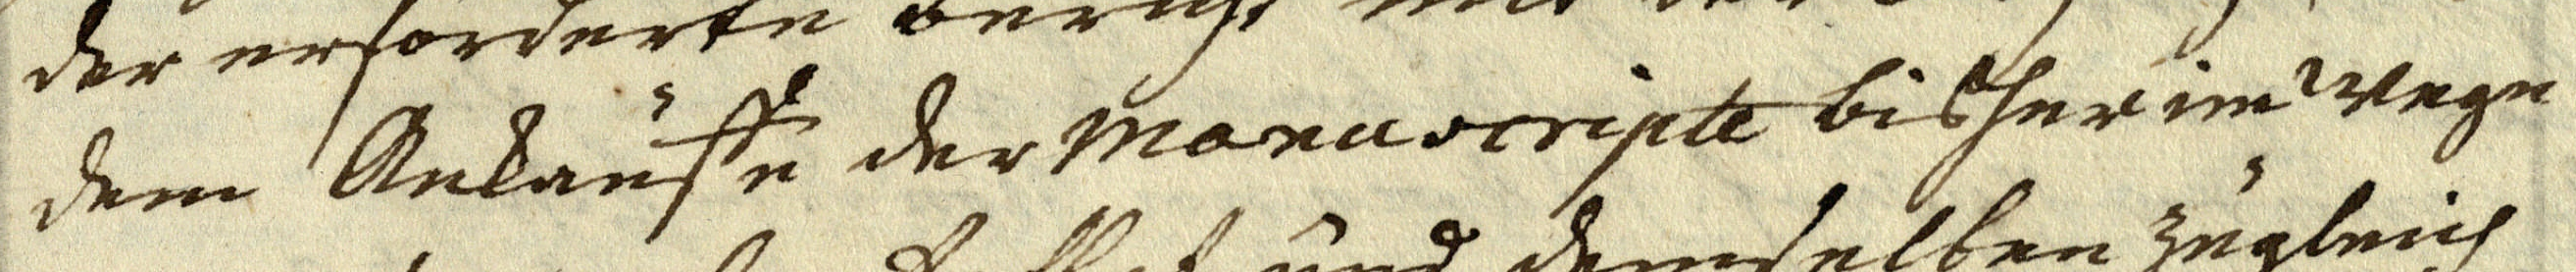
dem Ankauffe der Manuscripte bisher im Wege
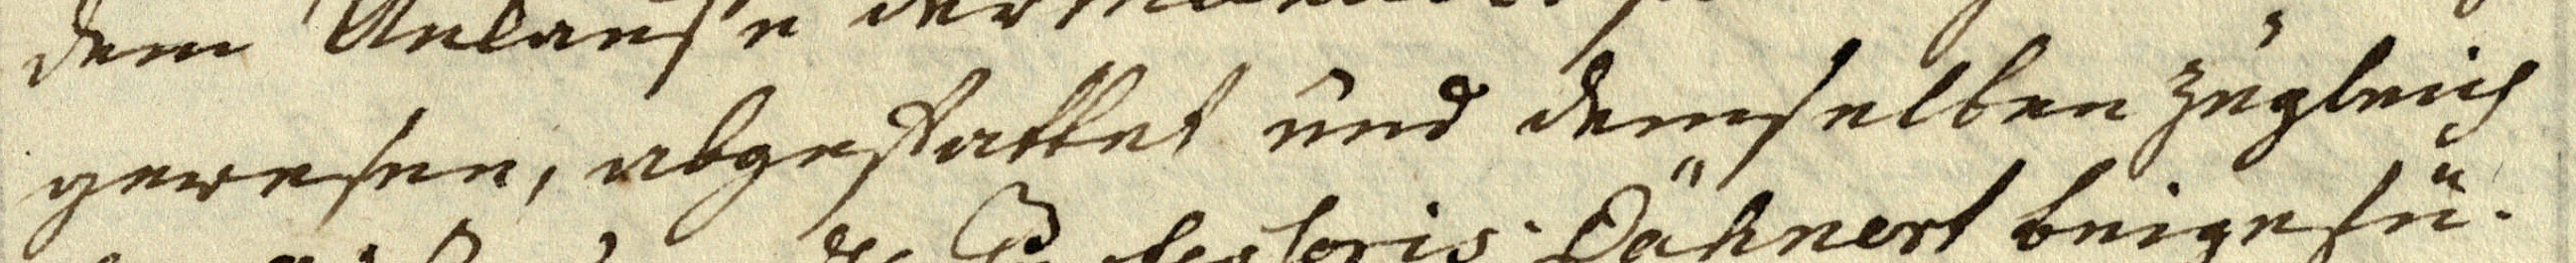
gewesen, abgestattet und demselben zugleich
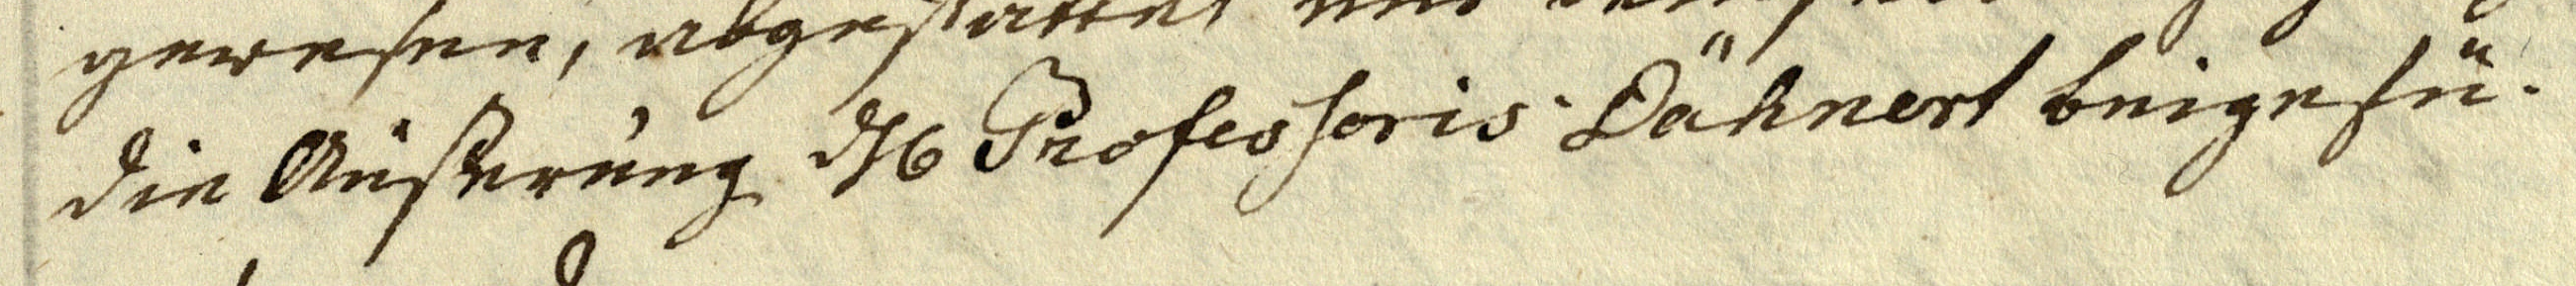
die Äußerung dh. Professoris Dähnert beigefü¬
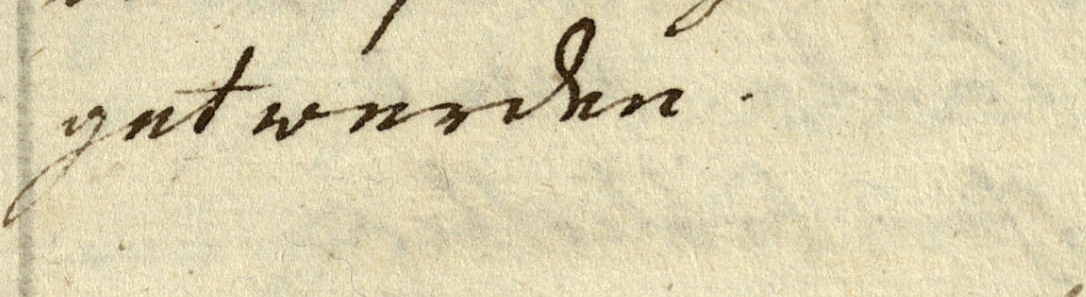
get werden.
